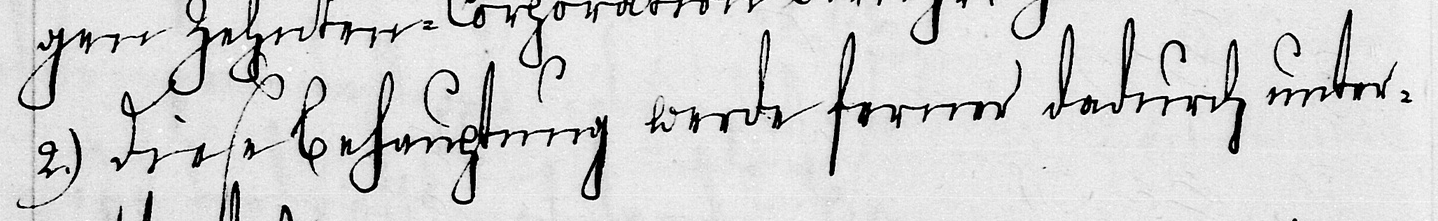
2.) Diese Behauptung werde ferner dadurch unter¬
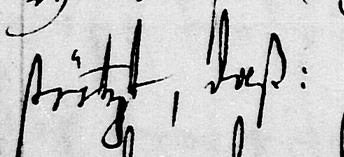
stützt, daß:
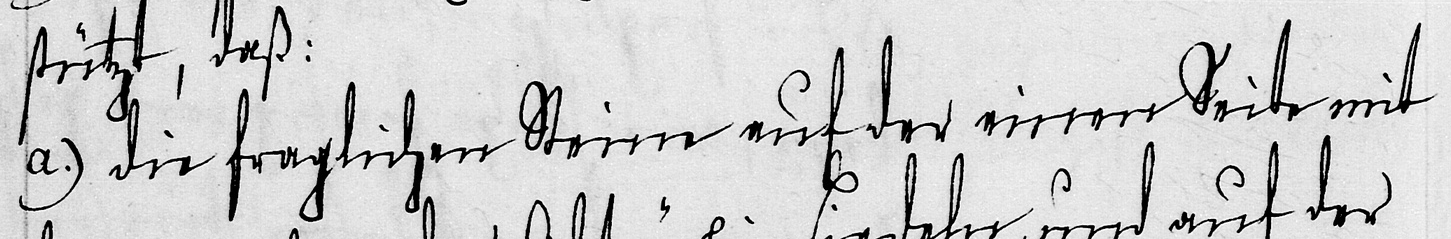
a.) die fraglichen Steine auf der einen Seite mit
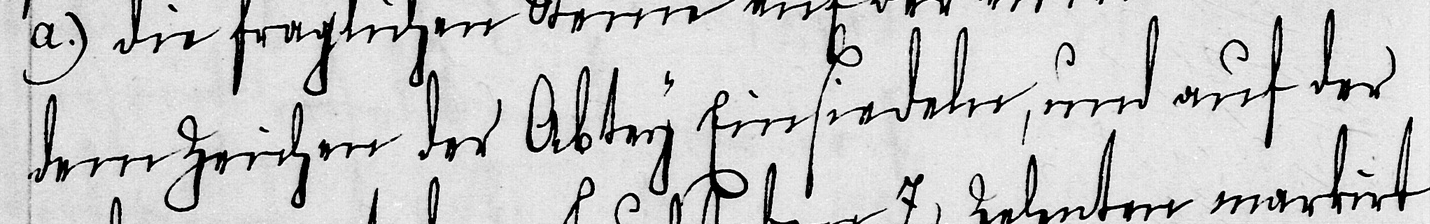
dem Zeichen der Abtey Einsiedeln, und auf der
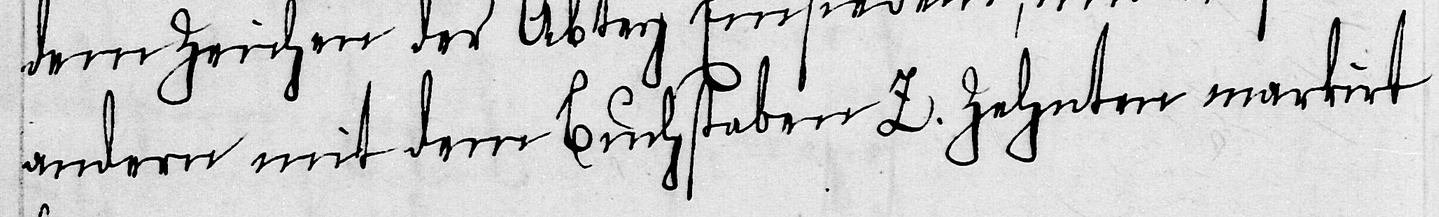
andern mit dem Buchstaben Z. Zehnten markirt
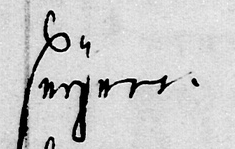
seyen.
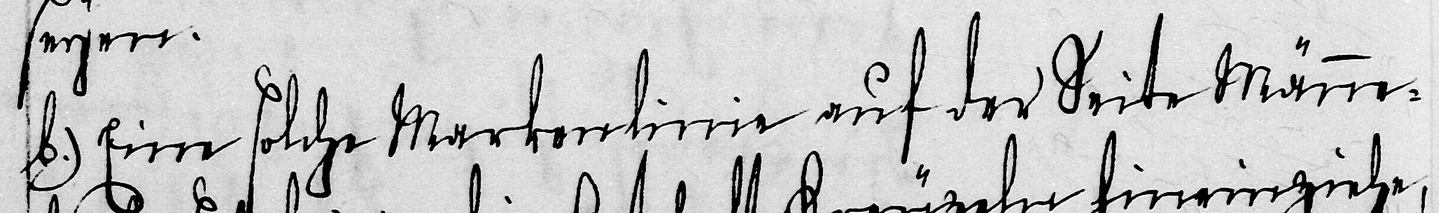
b.) Eine solche Markenlinie auf der Seite Männe¬
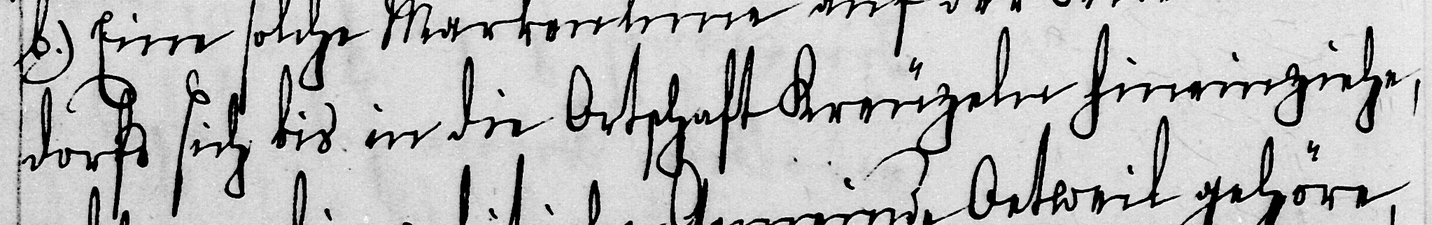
dorfs sich bis in die Ortschaft Kreuzeln hineinziehe,
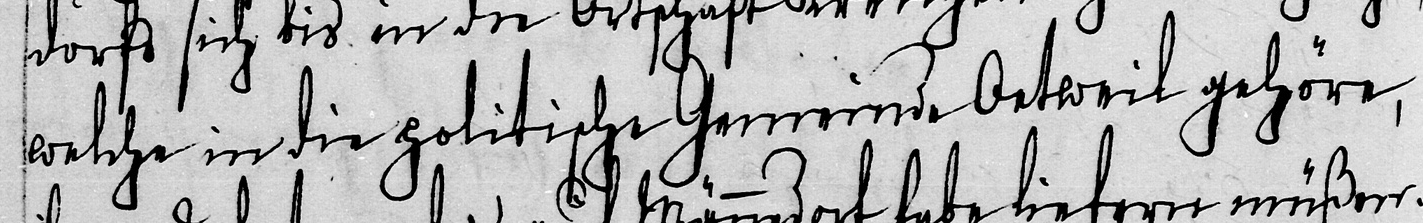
welche in die politische Gemeinde Oetweil gehöre,
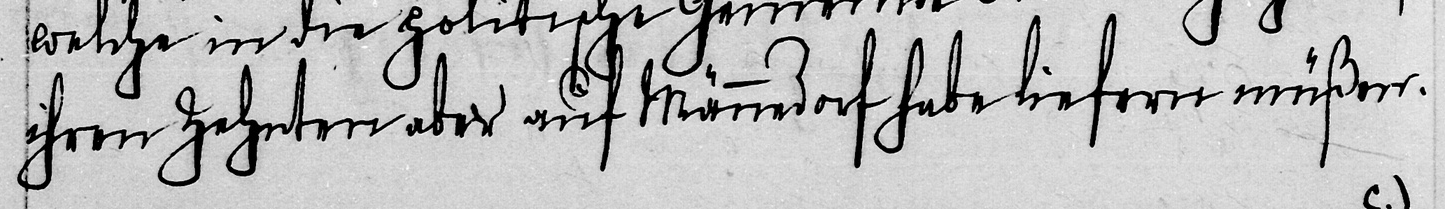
ihren Zehnten aber auf Männedorf habe liefern müßen.
